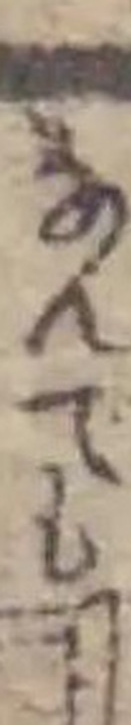なんでも
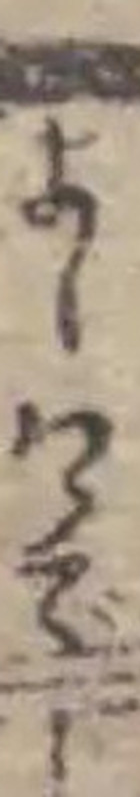よしはらで
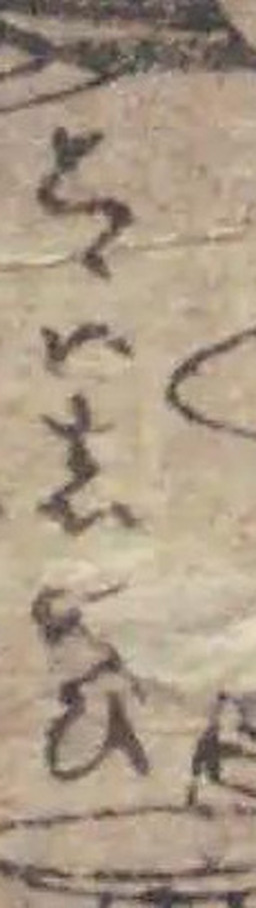こゝはしひ
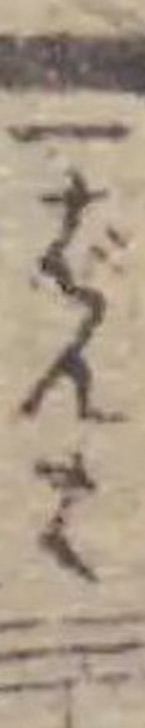一ばんは
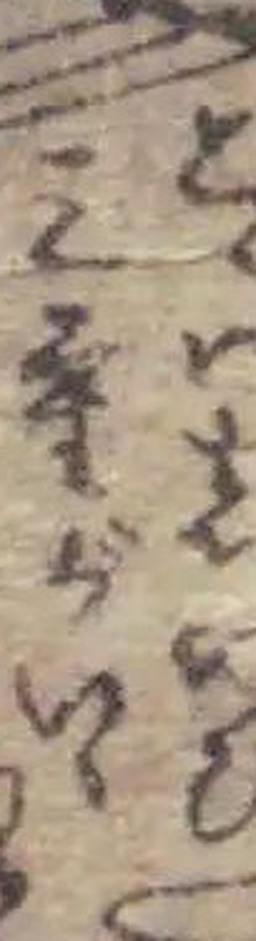三平がいゝ
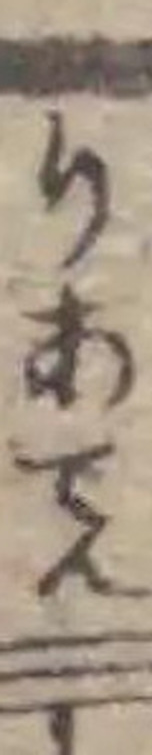りあてん
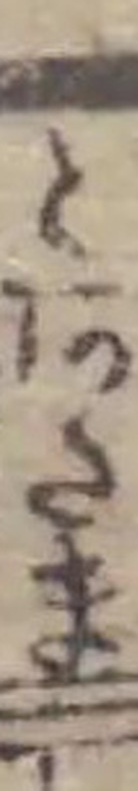とあたま
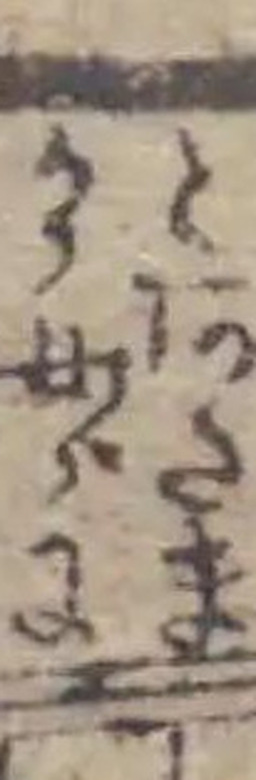から女郎に
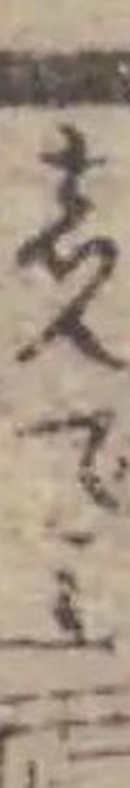しんでみ
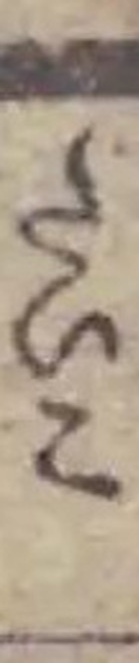たいこ
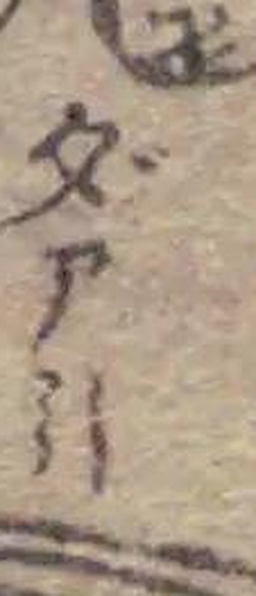ダア引
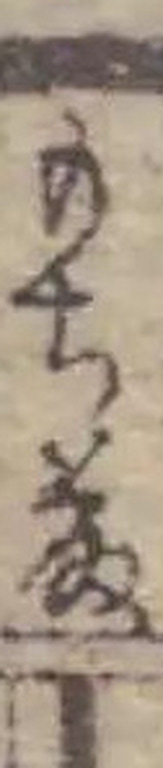もち藤
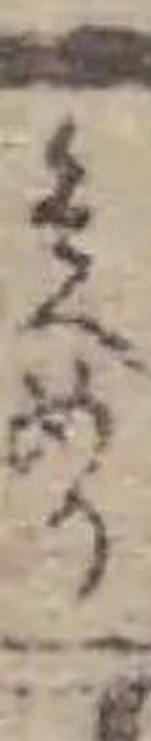兵へめり
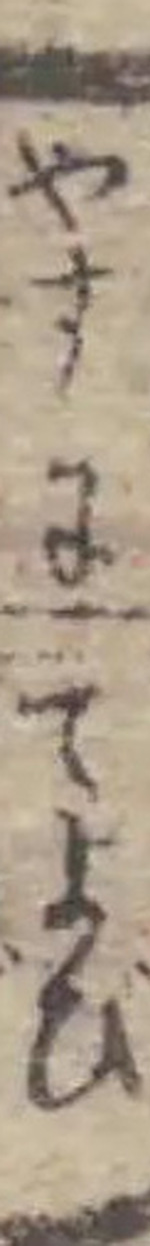やすにてよび
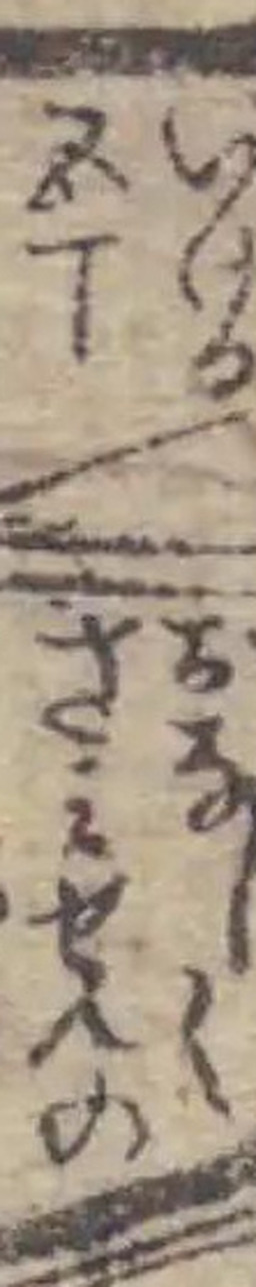五丁さみせんの
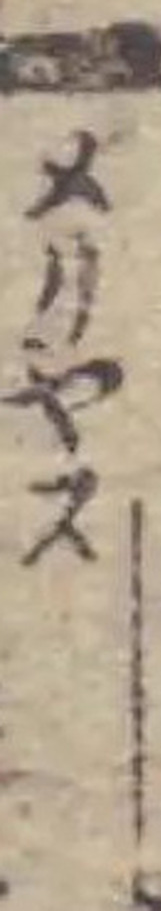メリヤス
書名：色男其処此処 3巻
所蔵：国立国会図書館 National Diet Library, JAPAN
